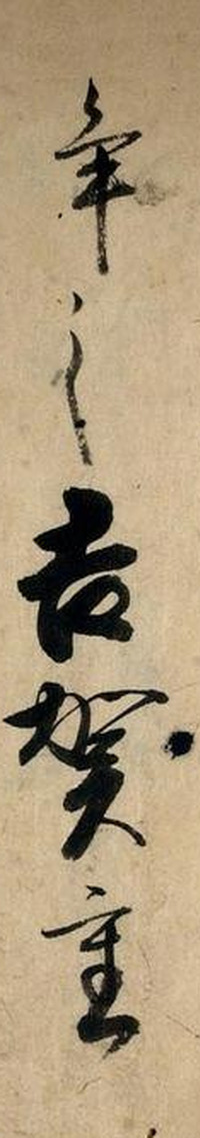年之吉賀重
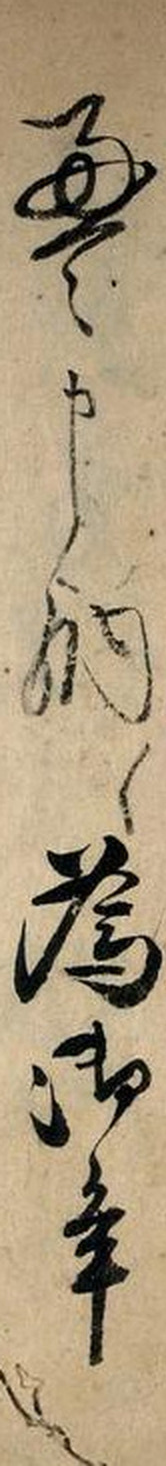畳申納候為御年
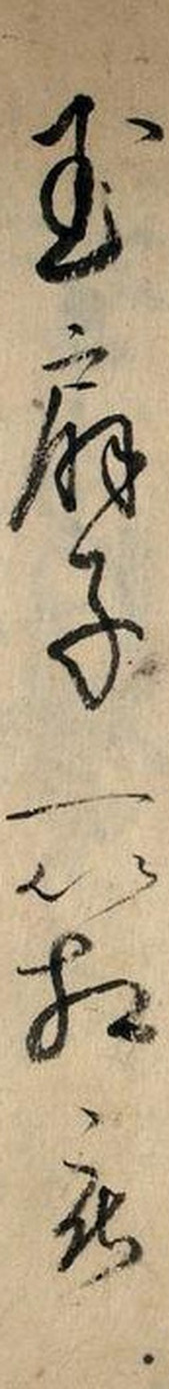玉扇子一箱被
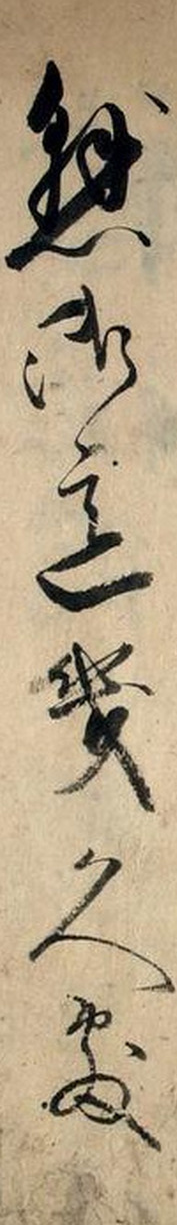懸御意幾久敷

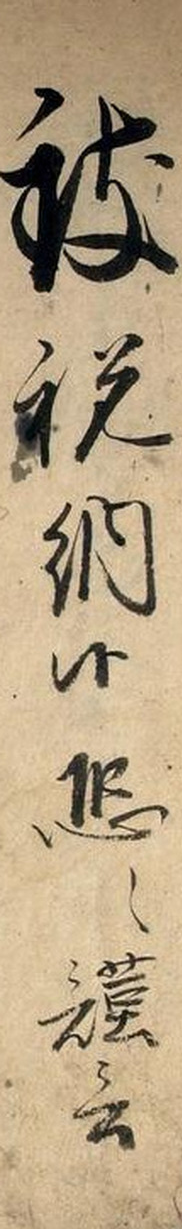致祝納候恐々謹言
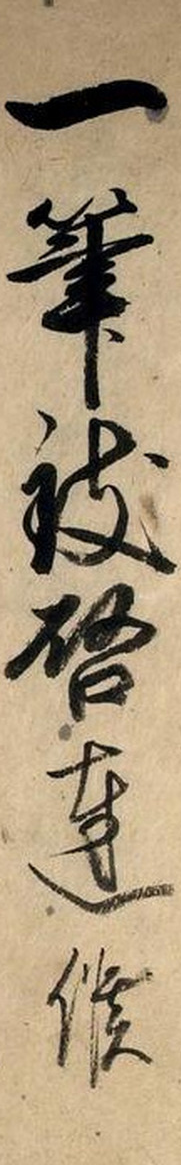一筆致啓達候
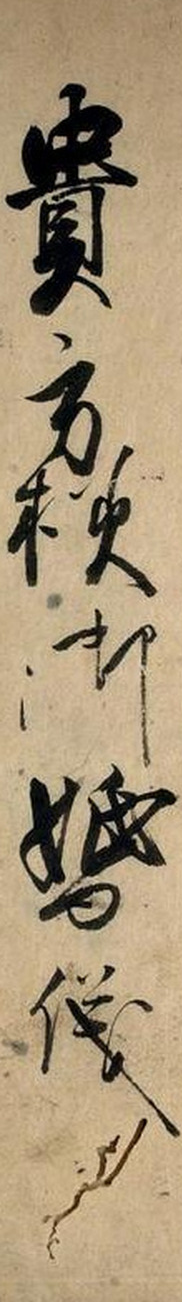貴方様御婚儀
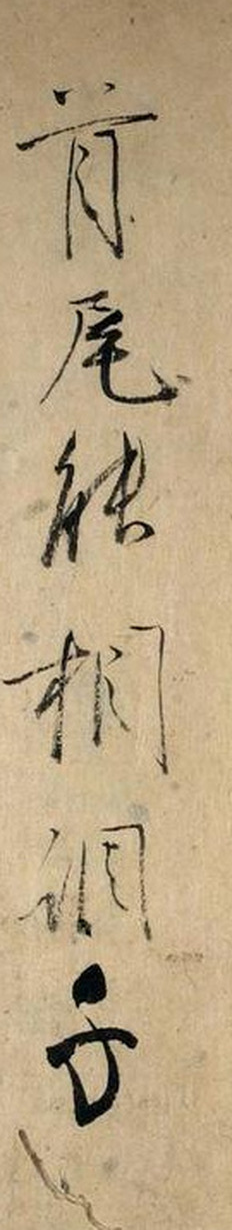首尾能相調千
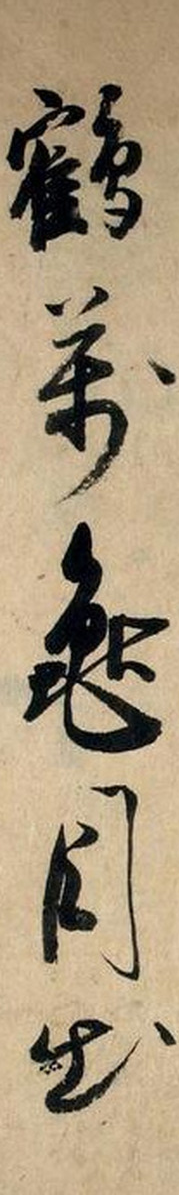鶴萬亀目出
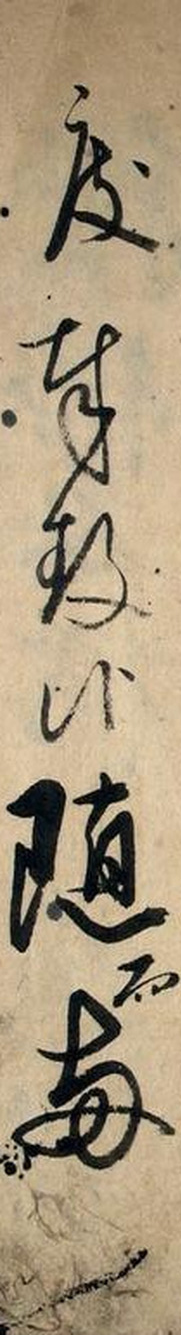度奉存候随而両

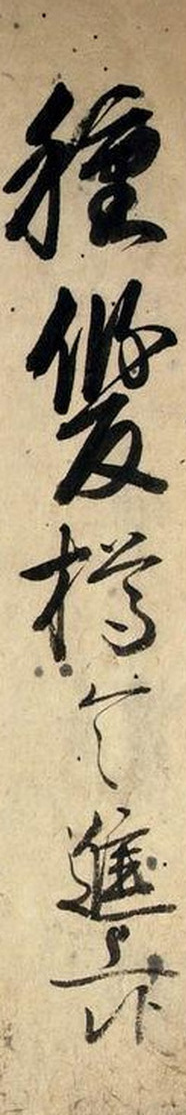種双樽令進上候
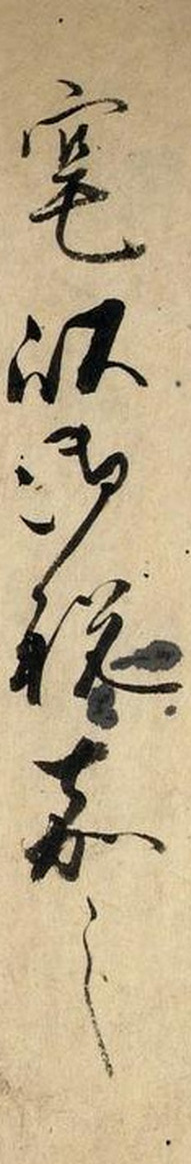寔以御祝嘉之
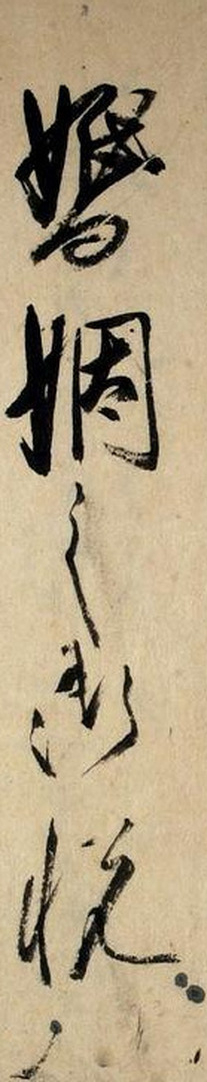婚姻之御悦
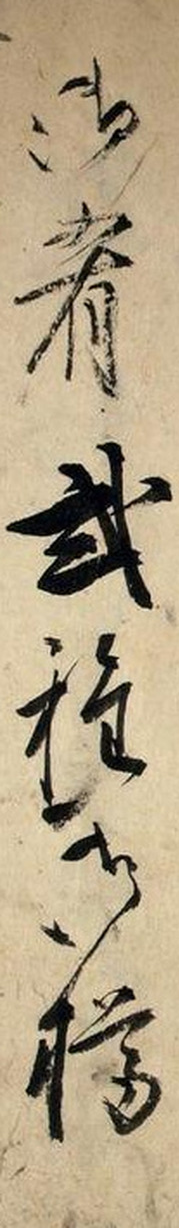御肴弐種御樽

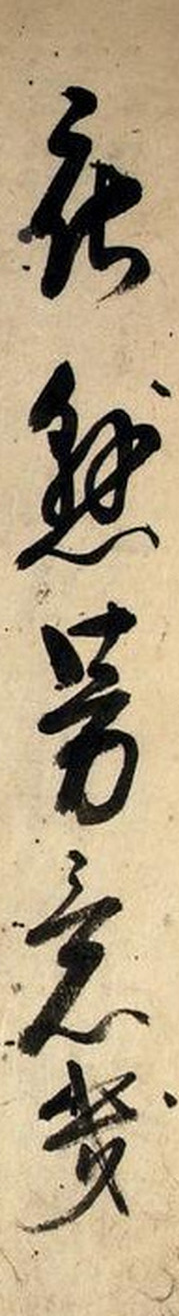被懸芳意幾
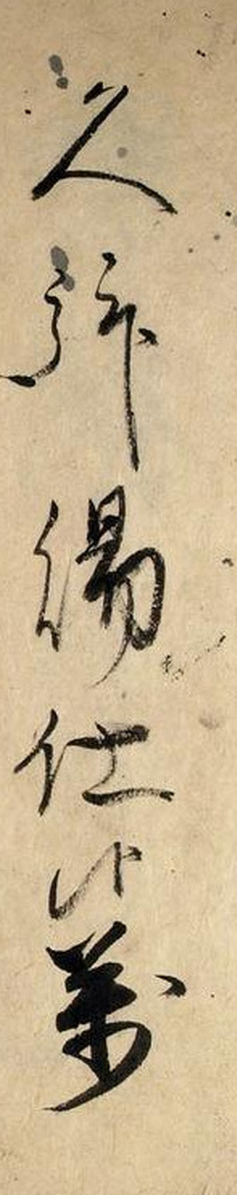久拝賜仕候万
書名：御手本（手習、消息文、和漢朗詠集・論語の一節）
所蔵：福井県文書館 Fukui Prefectural Archives
